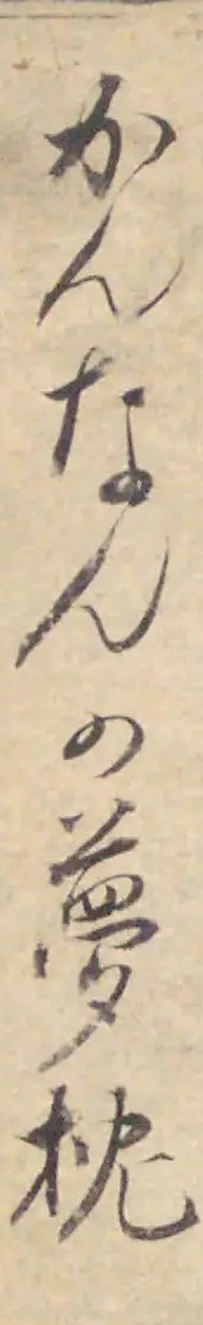かんなんの夢枕全

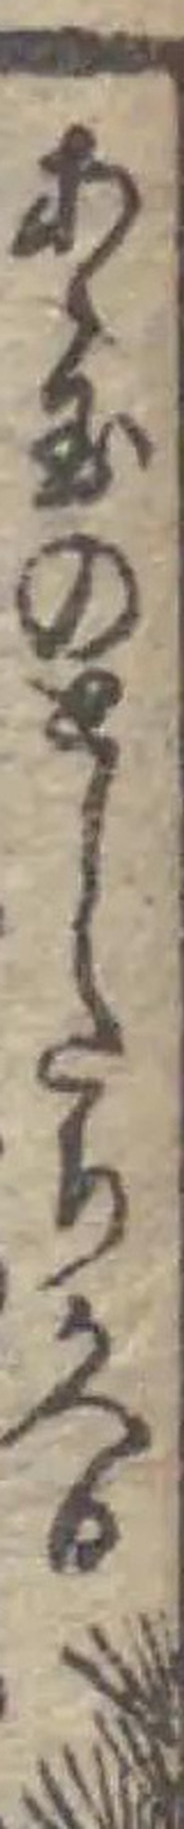あら玉のとしたちかへる
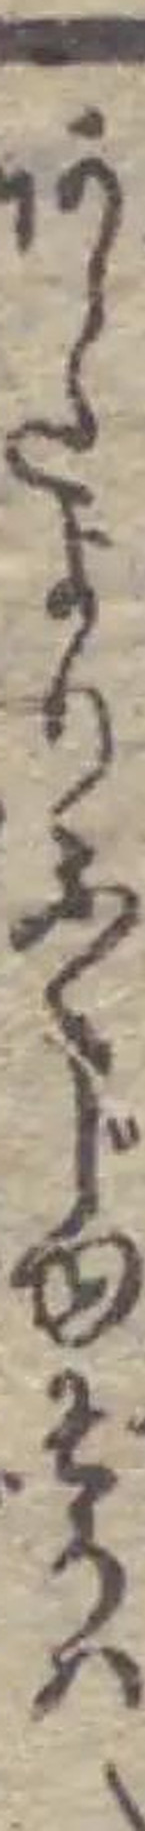あしたよりふくじゆそうは
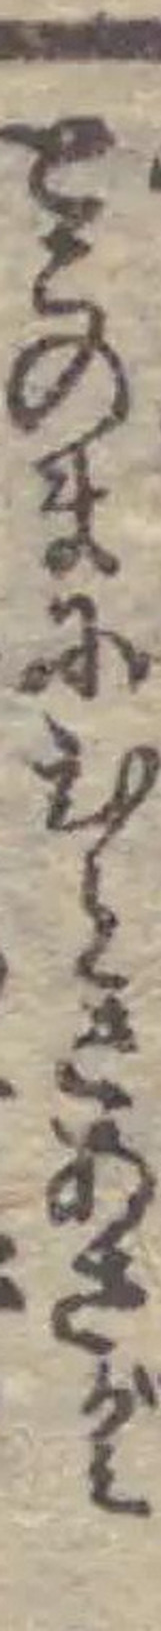とこのまにひゝきあさがみ
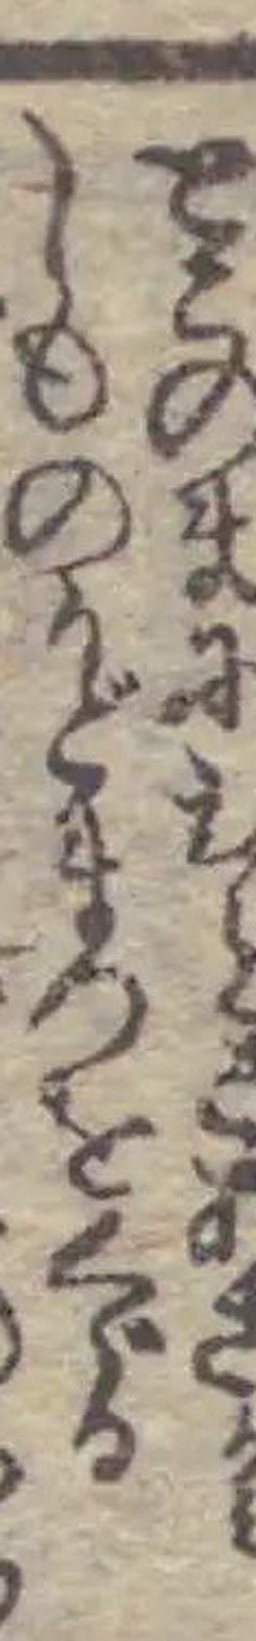しものかどまつをくゞる
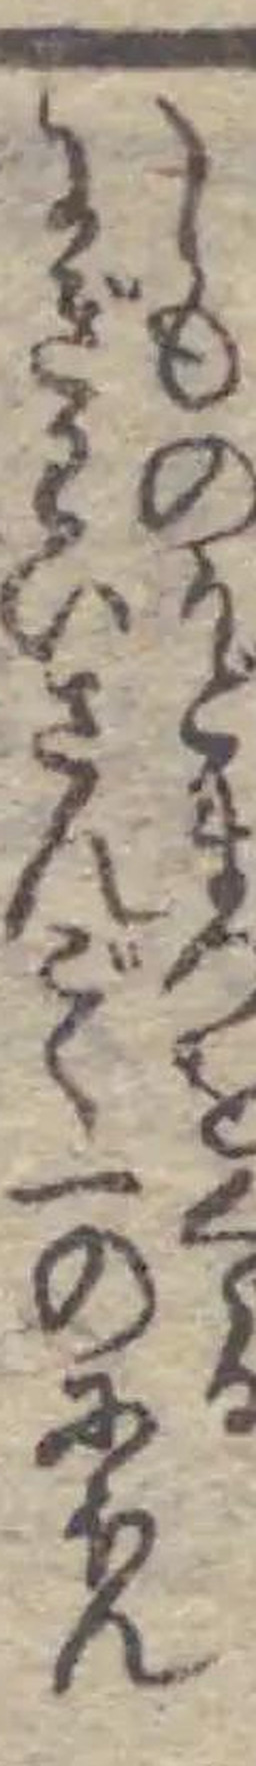にぎわいさんごく一のにほん
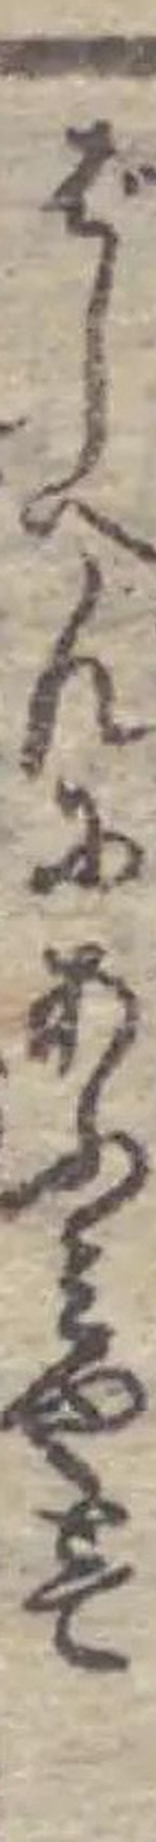ばしへんにあふみやとて
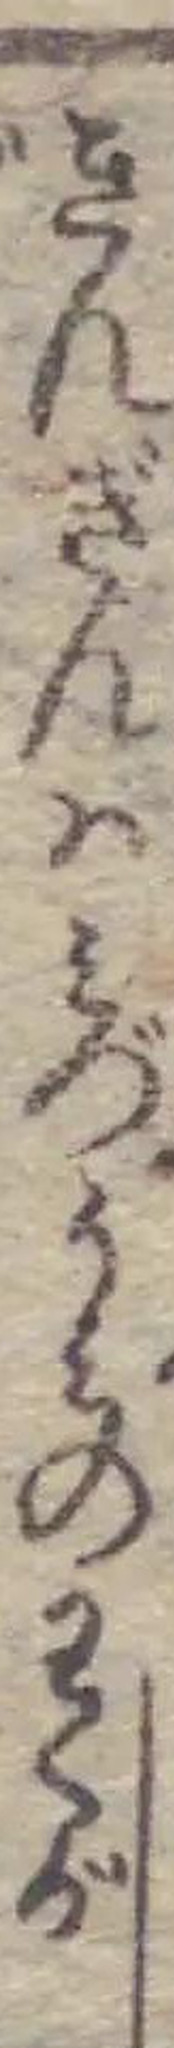きんぎんはみづうみのわくが
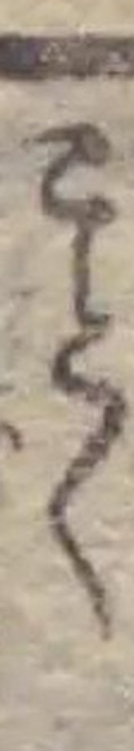ごとく
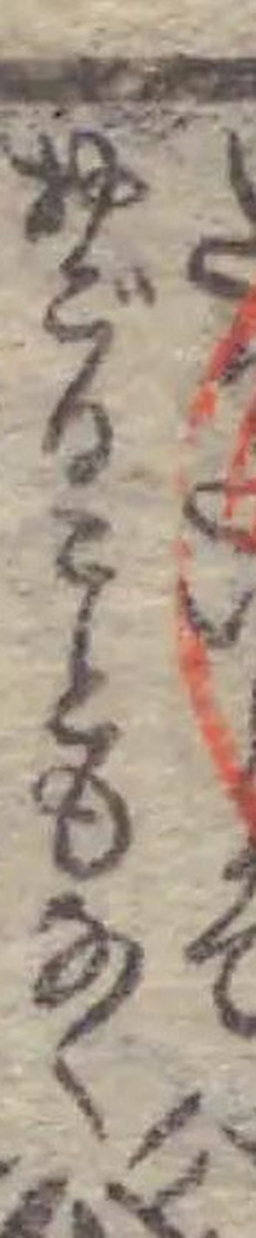おごることもなく
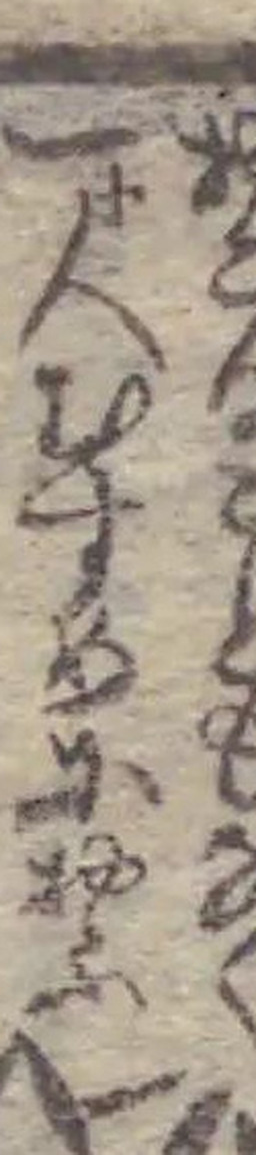一ト人むすめにおふ
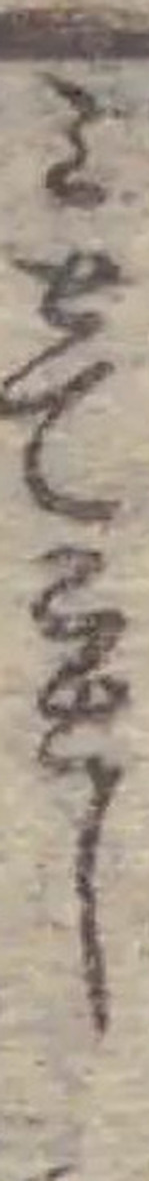みとてことし
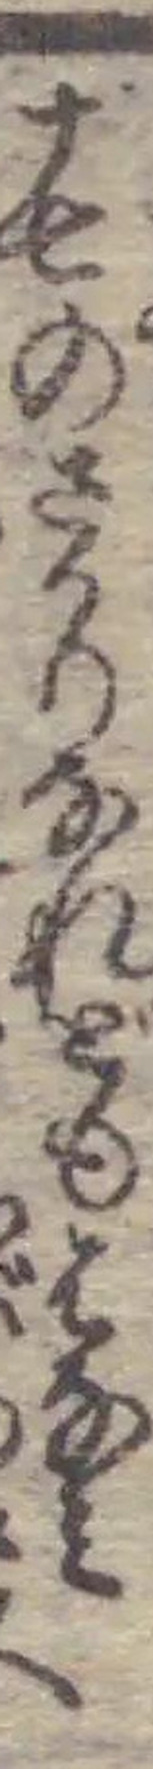十七のさかりなれどもはなみ
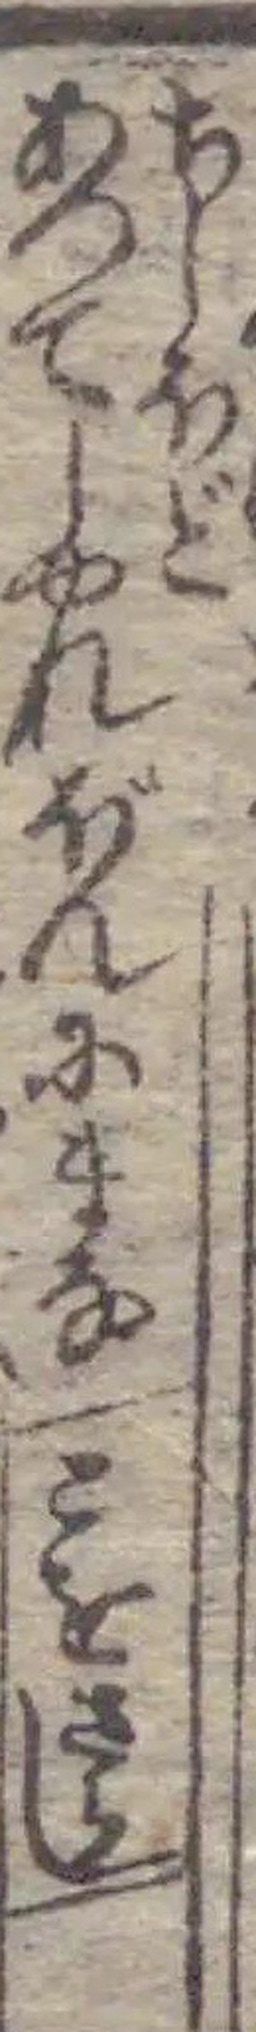あつてしやれぼんにまなこをさらし
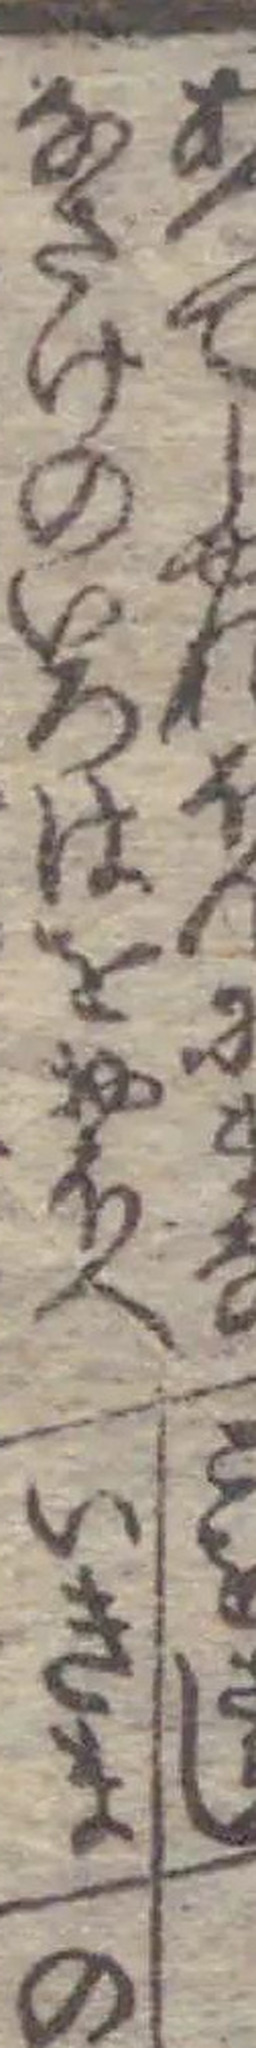なさけのいろはをおほへいきまの
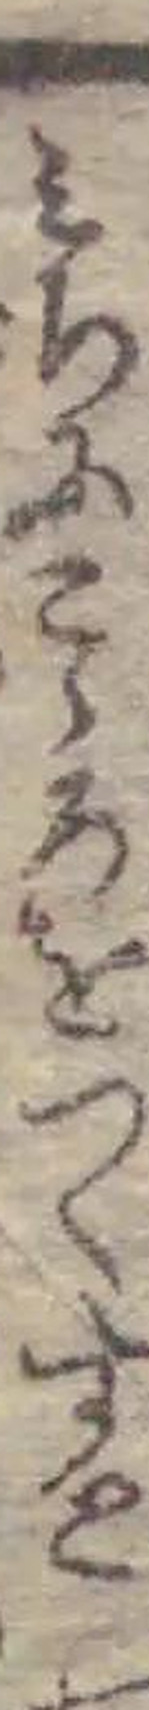みちにこゝろをつくすと
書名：かんなんの夢枕 2巻
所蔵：国立国会図書館 National Diet Library, JAPAN
